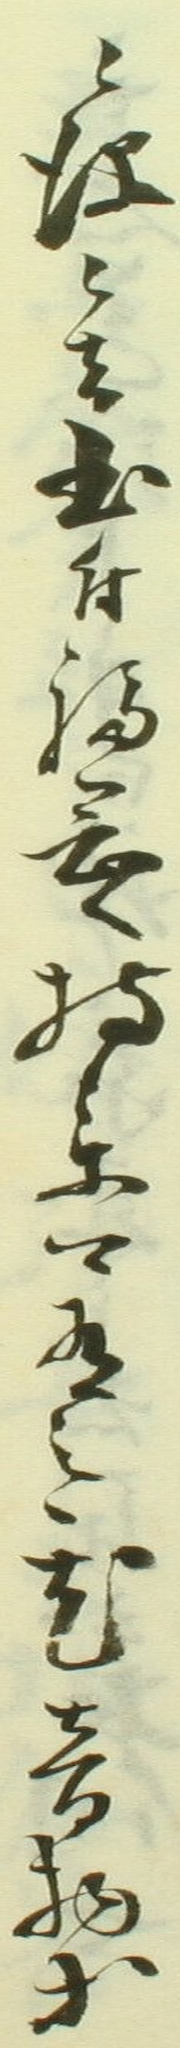候儀ニ者書付福岡へ持参可有之候尤音物等
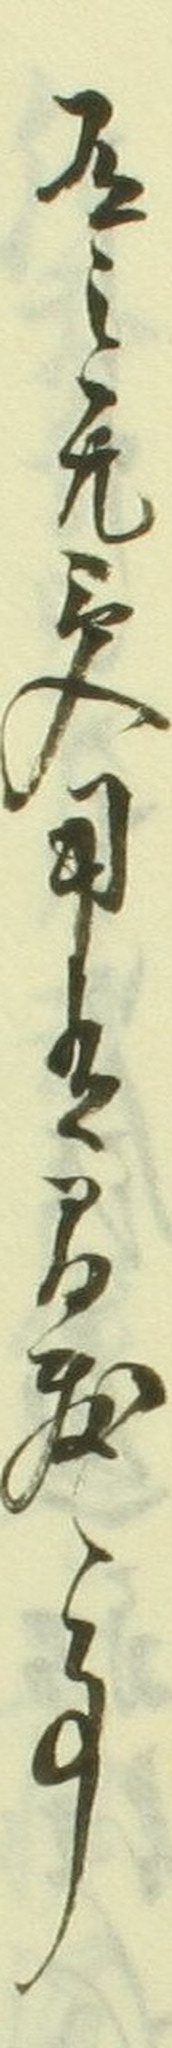有之候共受用有間敷候事
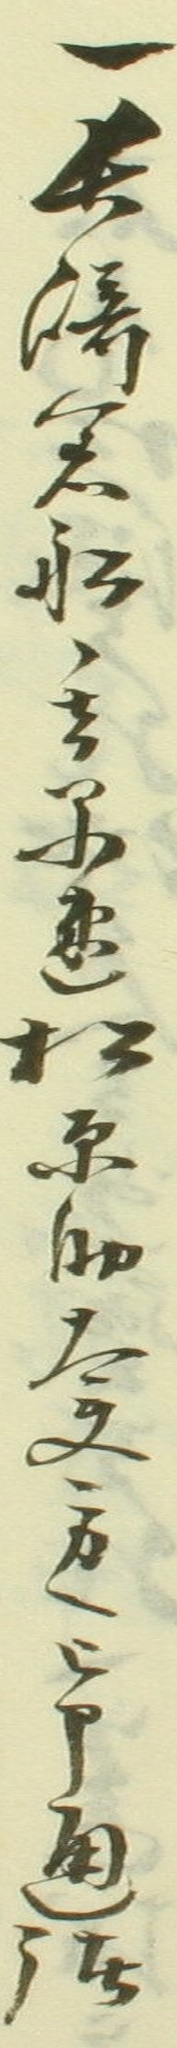一長崎着船候旨早速松原助太夫方へ被申通談
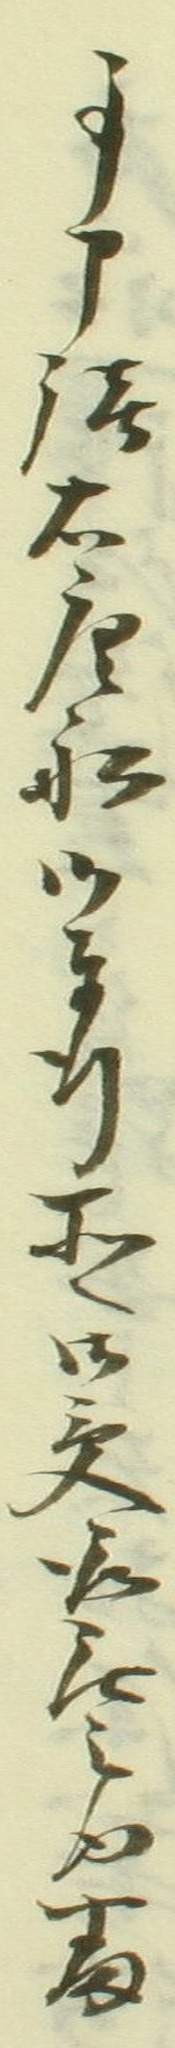事申談右唐船御奉行所へ御受取無之内番
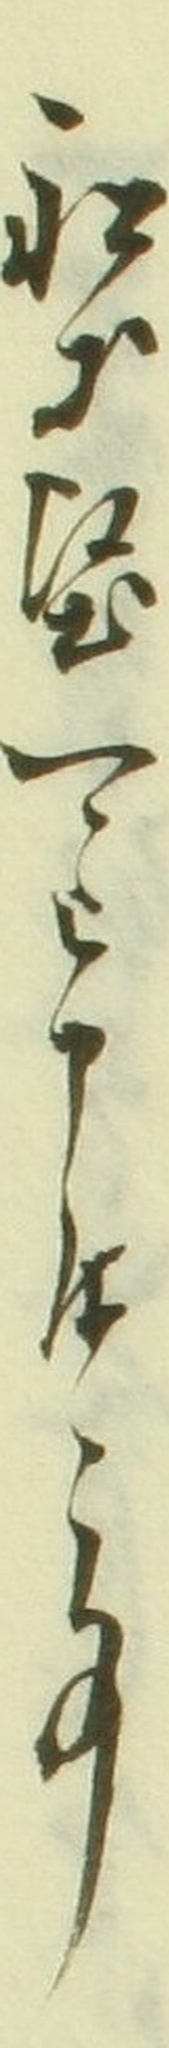船等堅可被申付候事
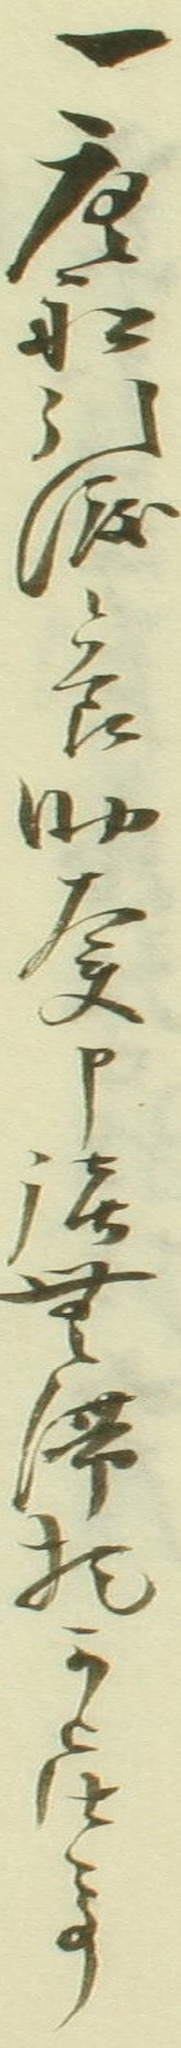一唐船引渡之節助太夫申談無滞様可被仕候事
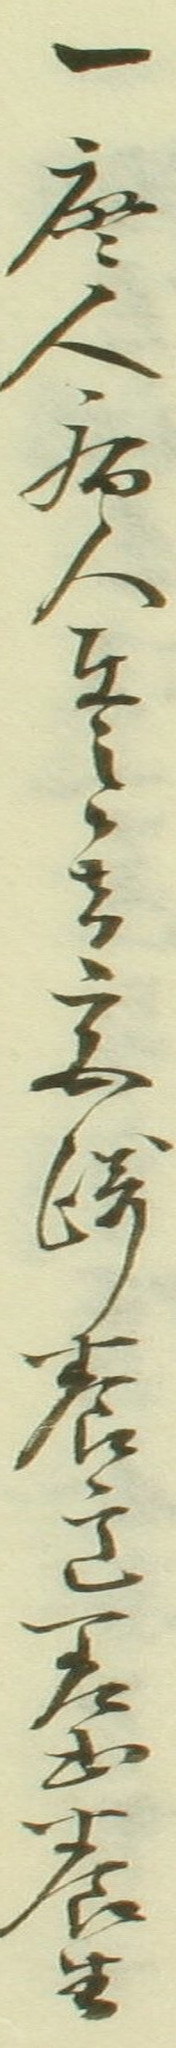一唐人病人在之候旨宮崎養意差出養生
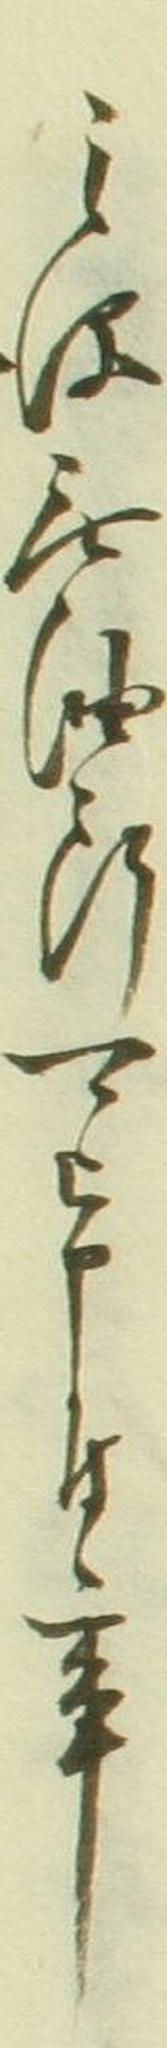之儀無油断可被申付候事
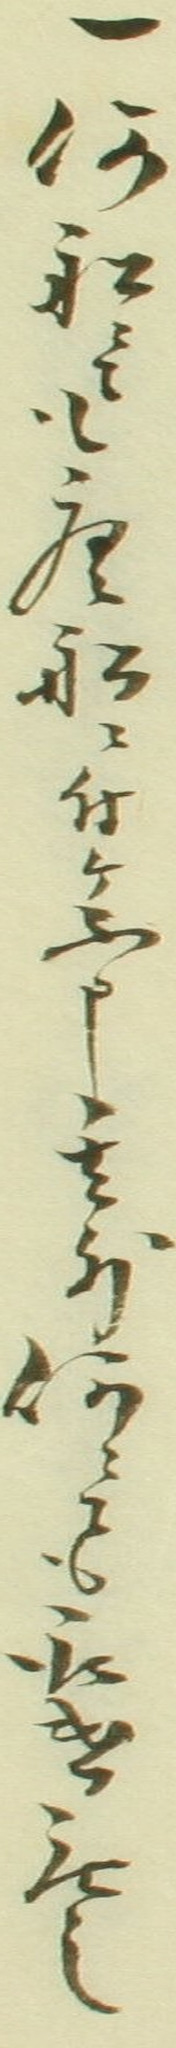一何船ニても唐船ニ付ケ不申其他何ニても取遣無之
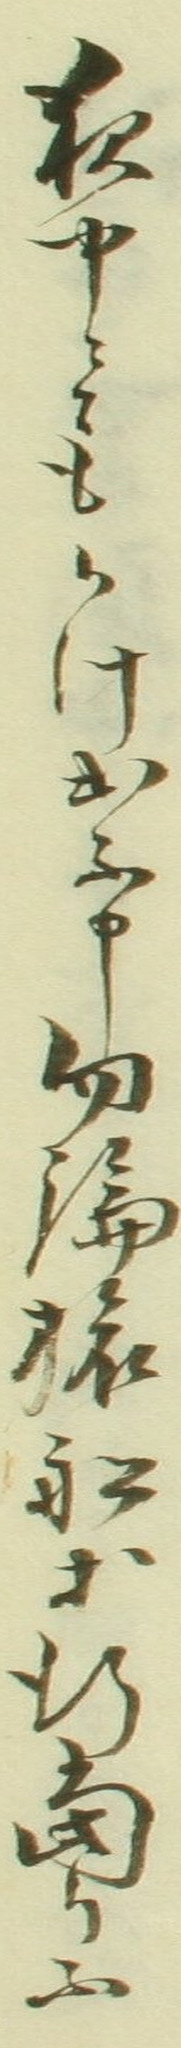夜中ニてもかけ出不申勿論旅船等行当り不
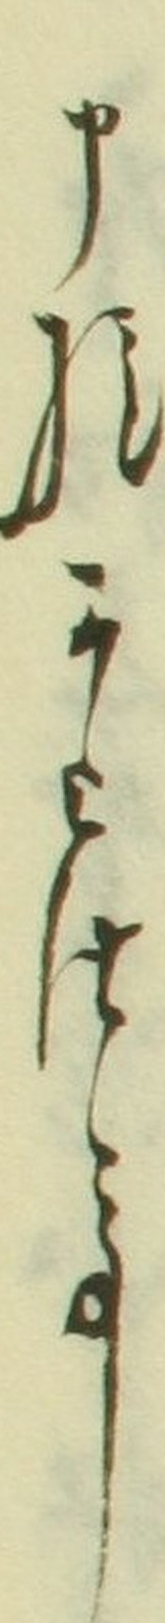申様可被仕候事

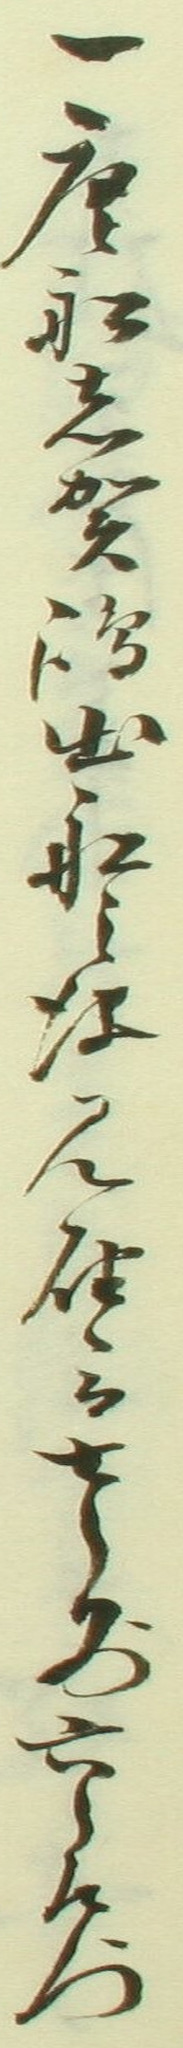一唐船志賀嶋出船之儀見届候而七郎右衛門六郎左衛門
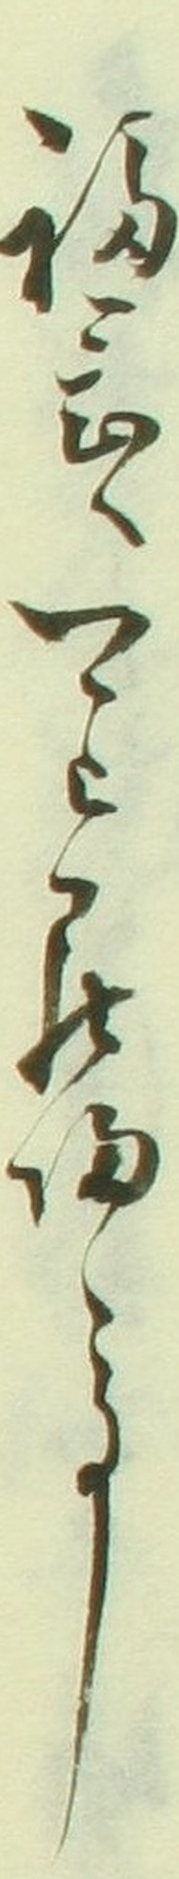福岡へ可被罷帰候事
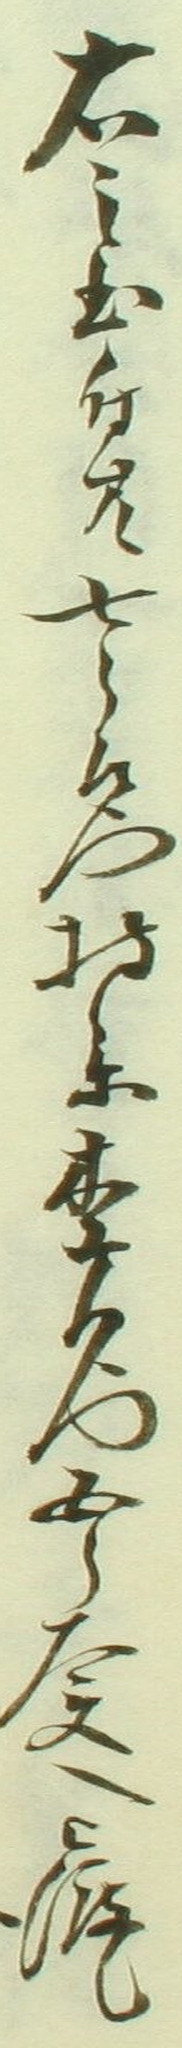右之書付共七郎左衛門持参杢左衛門五郎太夫へ被渡候
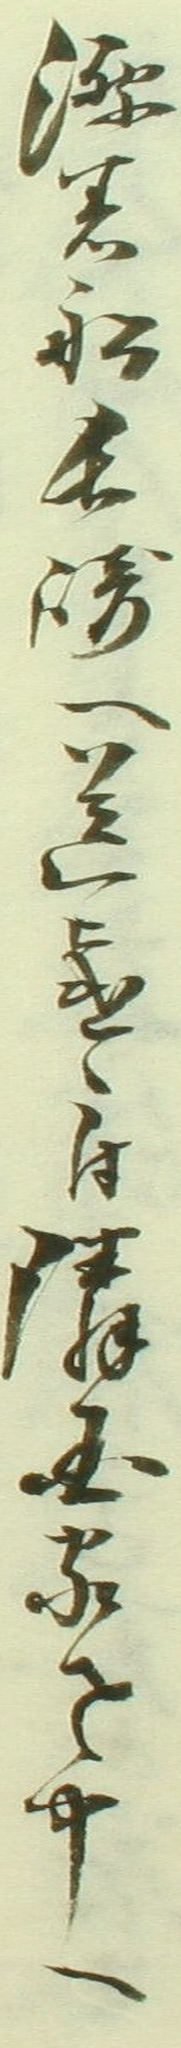漂着船長崎へ送被遣候付隣国家老中へ
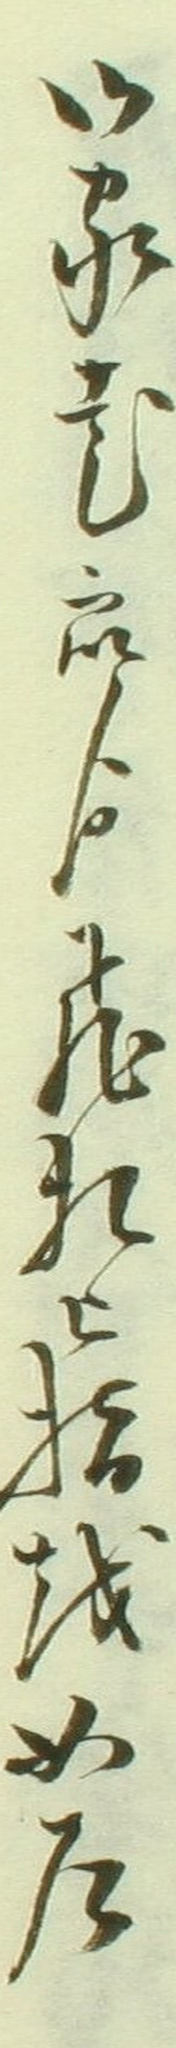御家老衆ゟ飛札被指越如左
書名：異国船漂着記
